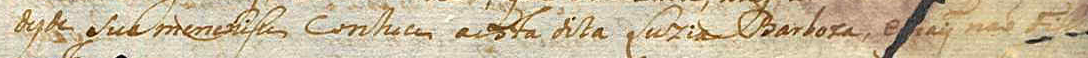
desde sua menenisse Conhece a esta dita Luzia Barboza, e mais naõ diss
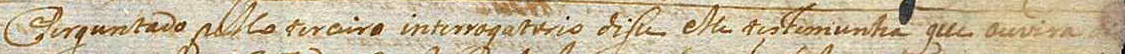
Perguntado pello terceiro interrogatorio disse elle testemunha que ouvira di
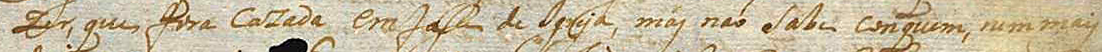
zer, que fora cazada em fasse de Igreja, más naõ sabe con quem, nem mais
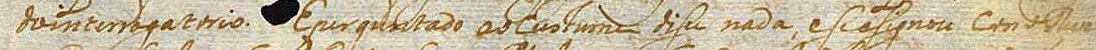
do interrogatorio. E perguntado ao custume disse nada, e se asignou con o Reve
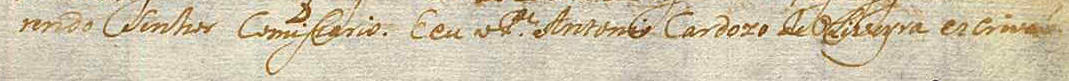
rendo Senhor Comissario. E eu o P.e Antonio Cardozo de Oliveyra escrivaõ
